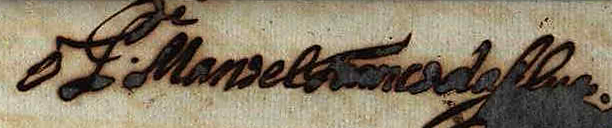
o P.e Manoel Franco da Silua.
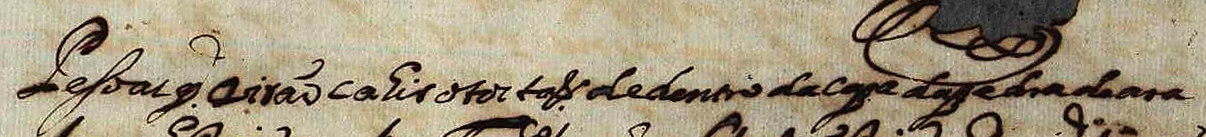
Pesoas q̄ viraõ cahir o tostaõ de dentro da capa da pedra de ara
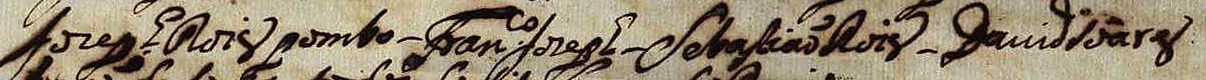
Jozeph Rois̄ pombo - Fran.co Jozeph - Sebastiaõ Rois̄ - Dauid soares
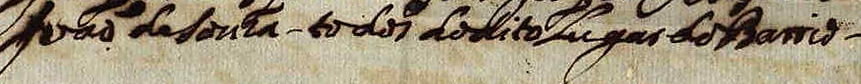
Joaõ de souza - todos do dito Lugar do Barrio -
